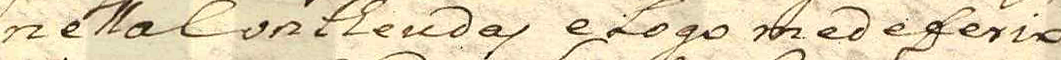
nella Contheudas e Logo me deferio
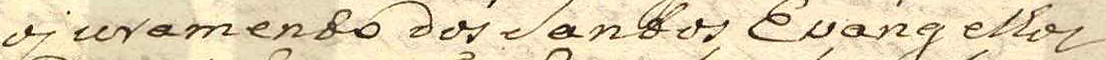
o juramento dos Santos Evangelhos
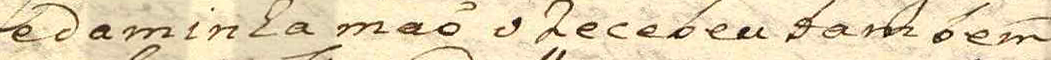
e da minha maõ o Recebeu tambem
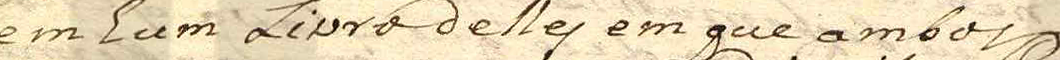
em hum Livro delles em que ambos
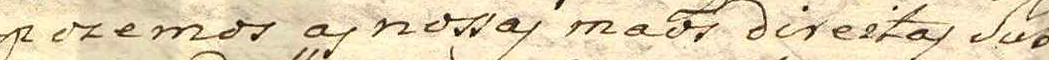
pozemos as nossas maos direitas sub
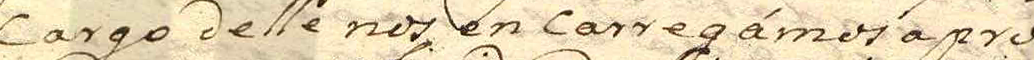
Cargo delle nos encarregámos a pro
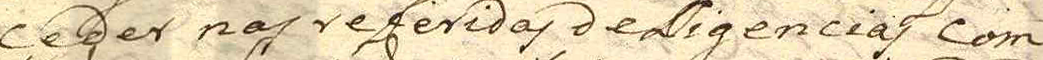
çeder nas referidas deLigencias com
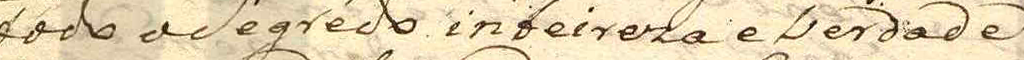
todo o Segredo inteireza e Verdade
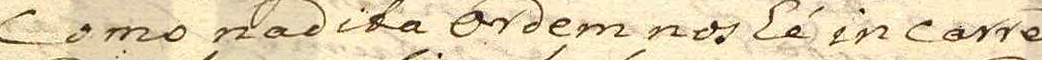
Como na dita Ordem nos hé incarre
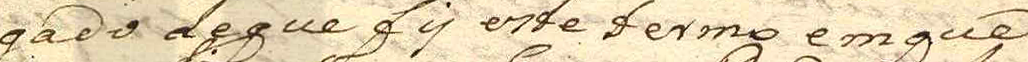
gado de que fis este termo em que
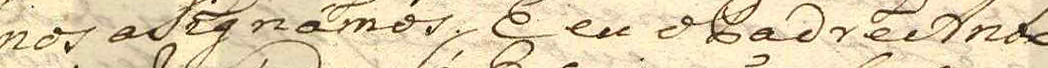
nos aSignámos. E eu o Padre Anto
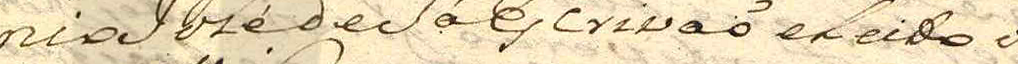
nio Iozé de Sá Escrivaõ eLeito o
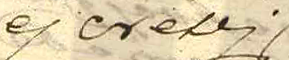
escrevj
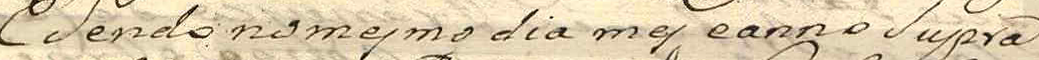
E Sendo no mesmo dia mes e anno Supra
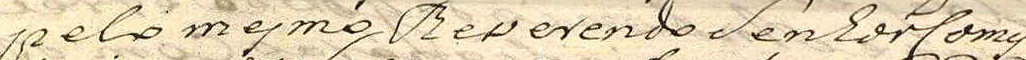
pelo mesmo Reverendo Senhor Comis
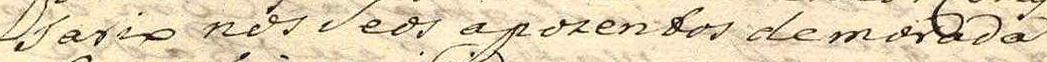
sario nos Seos apozentos de morada
